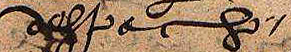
despacho ./.
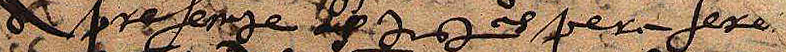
Apresemte as testas pera sere
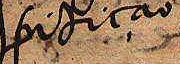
pitiçaõ
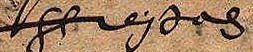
ffrejtas
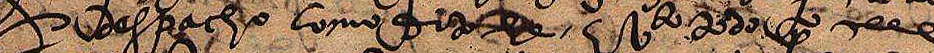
e despacho como dito he, E vto todo p̄o elle
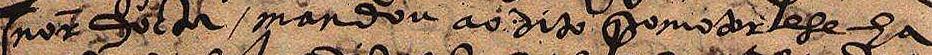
snor̄ doctor / mandou ao dito promotor lhe ha
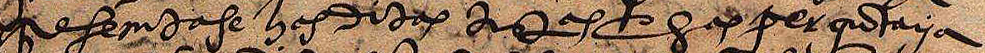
presemtase has ditas testas e has pergūtarja
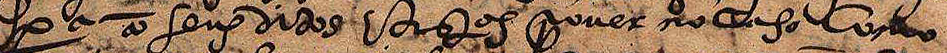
ꝑa c̄o seus ditos E testas prouer no caso Como
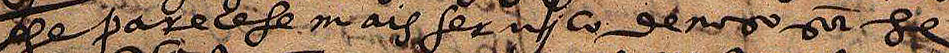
lhe parecese mais serujco de noso sōr he
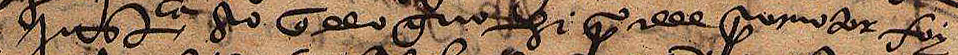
Justca, Ao q̄ lloguo asi p̄o elle promotor foy
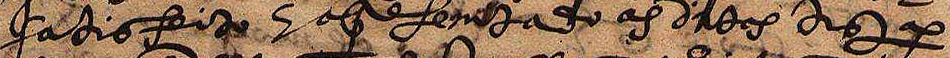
satisfeito E apresemtado as ditas testas
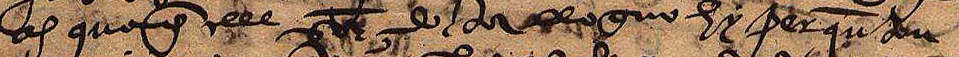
as quais elle sōr doctor lloguo hy pergūtou
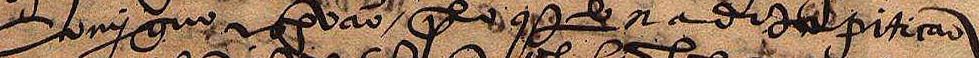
Comjguo esp̄vaõ / p̄lo ꝯtdo na dita piticão
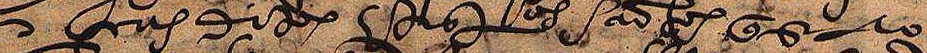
e seus ditos E testos são hos q̄ se ao
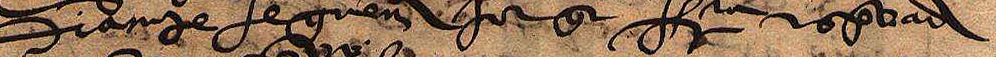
diamte seguem̄ Jorge ffrra esp̄vão
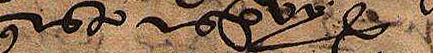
q̄ esto esp̄vy
